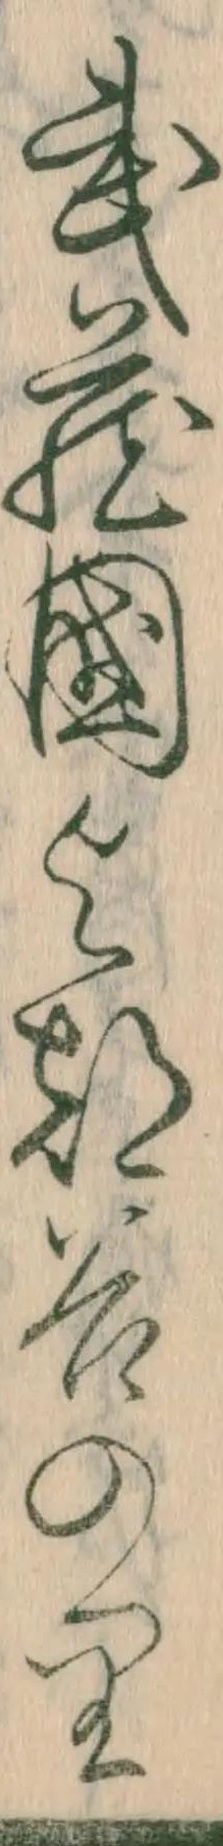武蔵国よつ谷の里
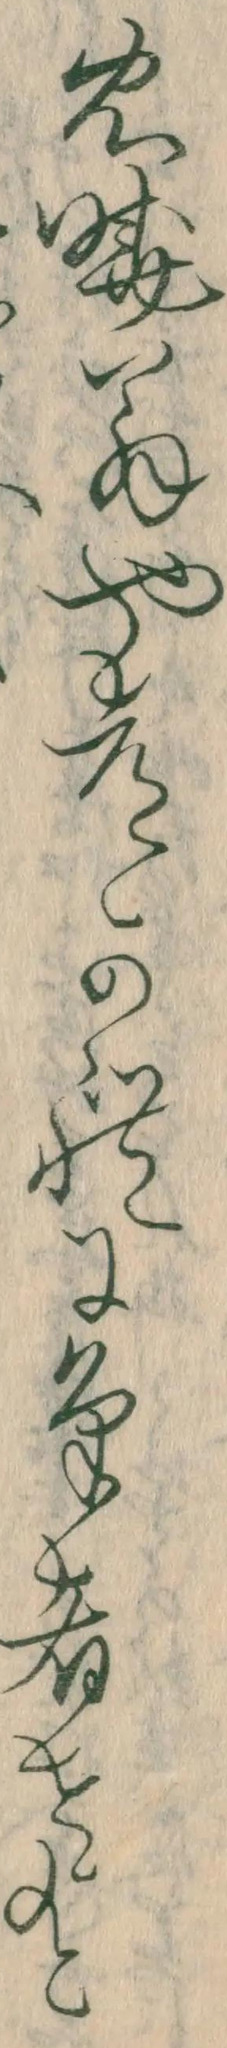忠暁翁やつかれに筆者せよと
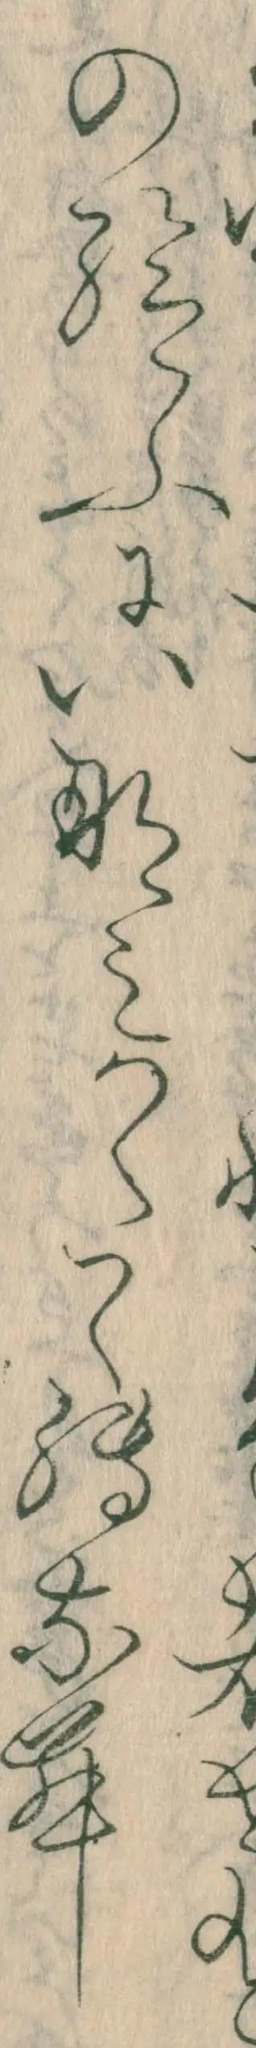の給ふにいなみかたくてなむ
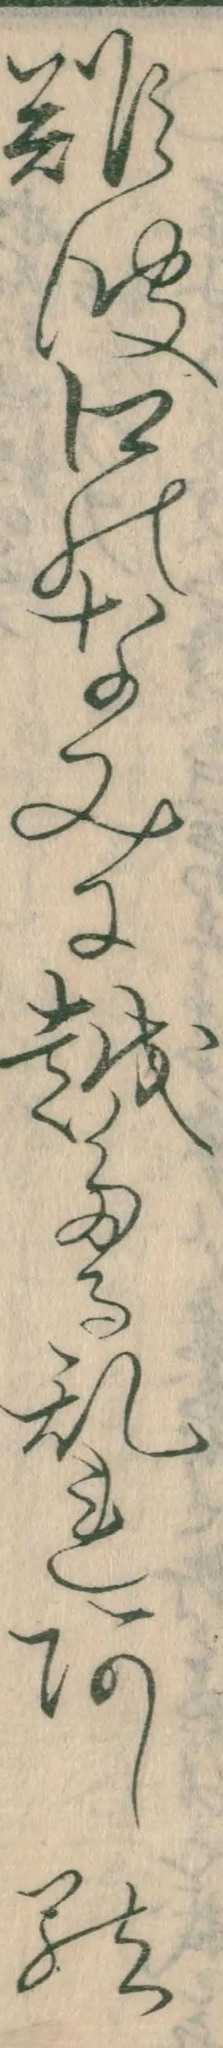難波江のなみに越たる乱れあしの
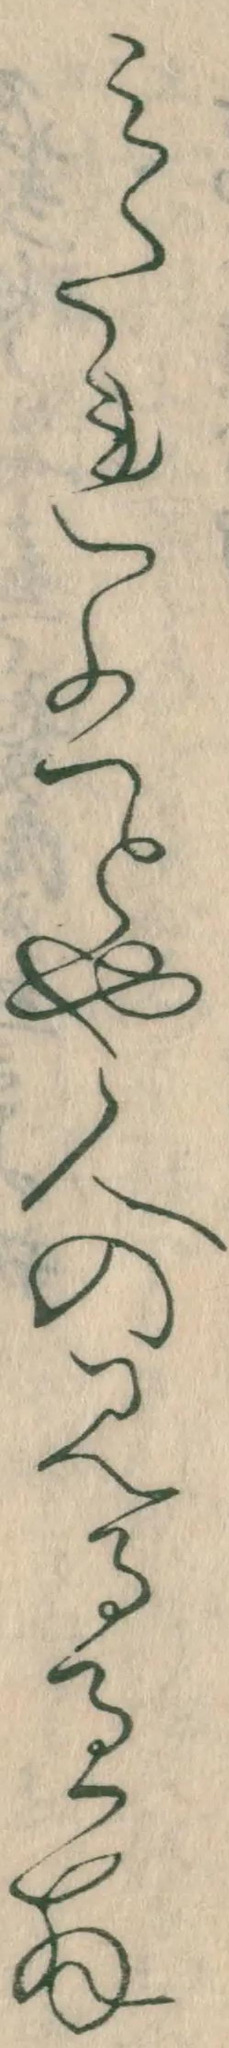みたれ書とや人の見るらむ

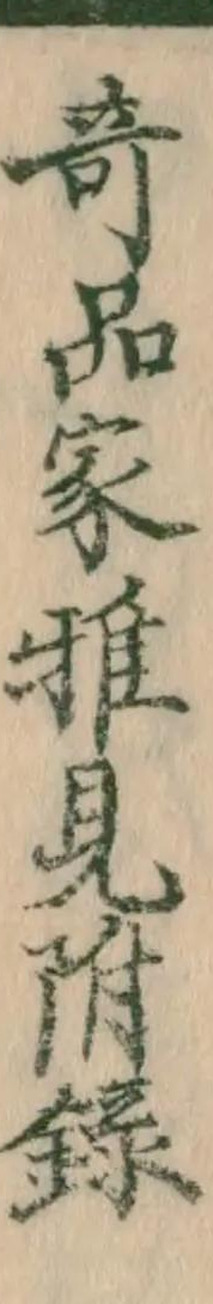奇品家雅見附録
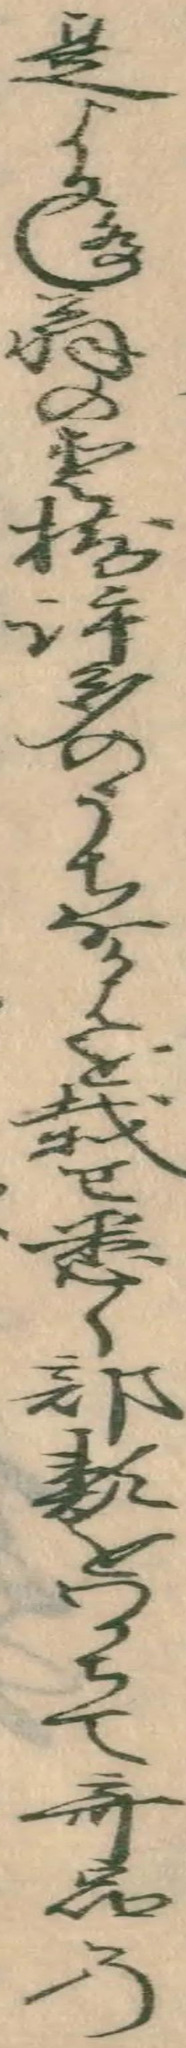是より水野翁の愛樹許多のうちなかはを載せ悉く部類をわかちて奇品の
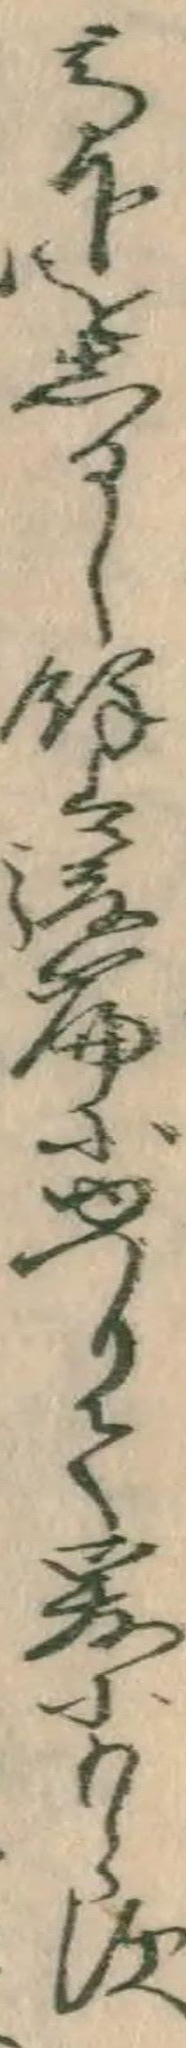高下をしるし余は後篇にゆつりて爰にもらす
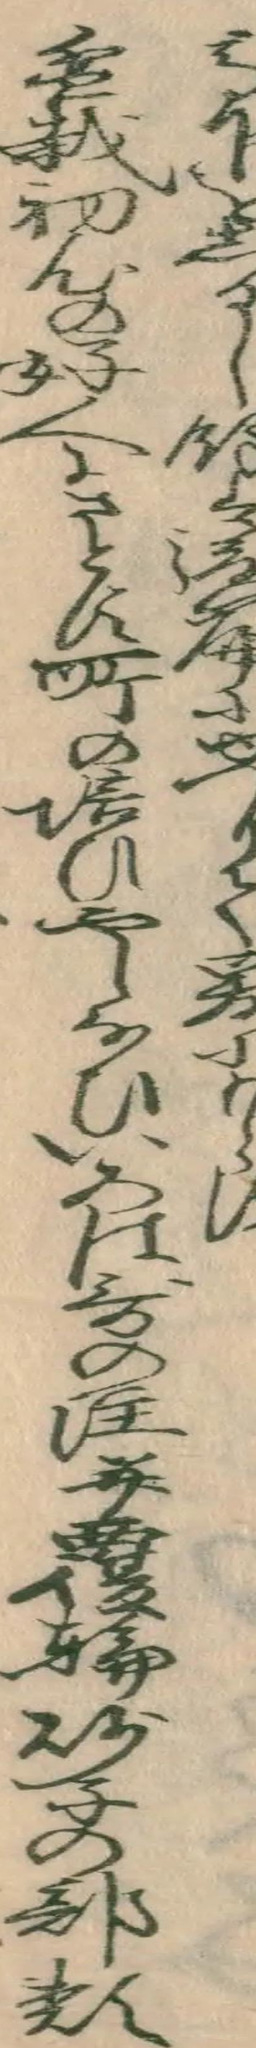盆栽初心の好人にさとす所の培ひやしなひいろは歌の注并覆輪砂子の部類
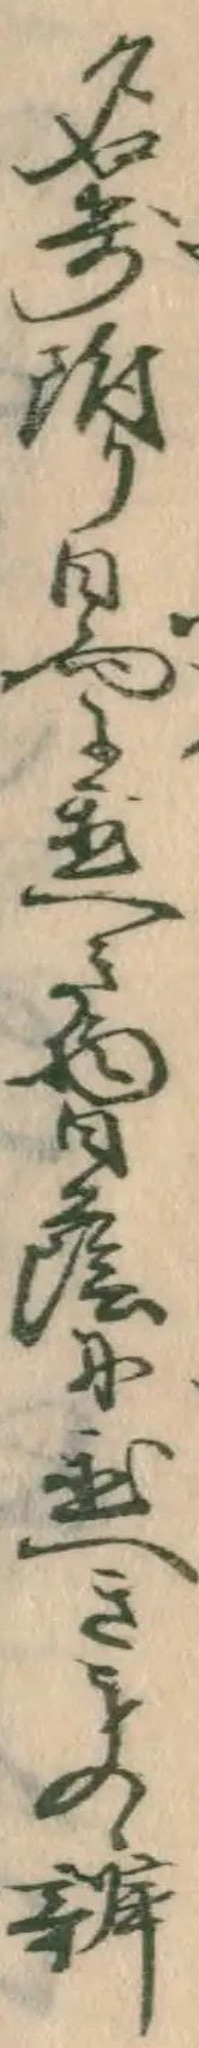名前附り日向に置へき物日陰に置くへきものゝ弁
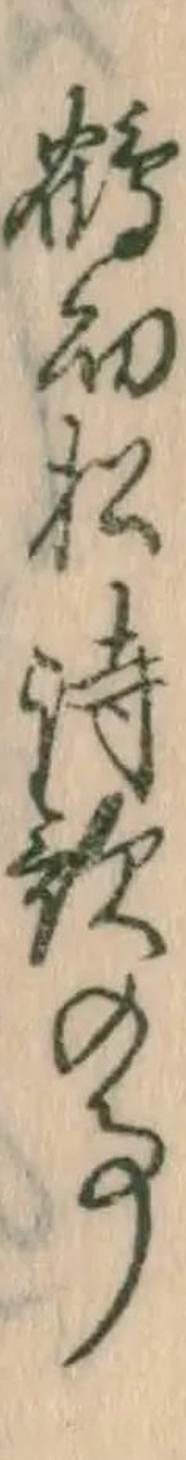鶴初松詩歌の事
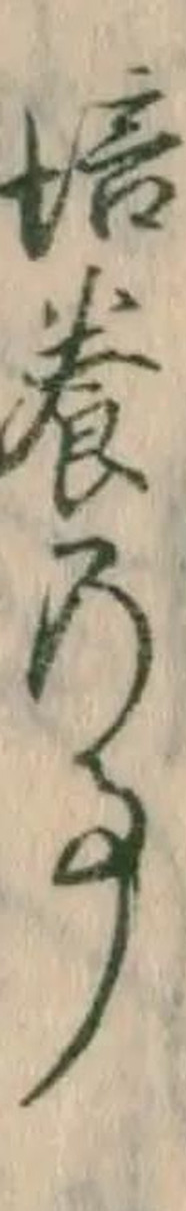培養の事
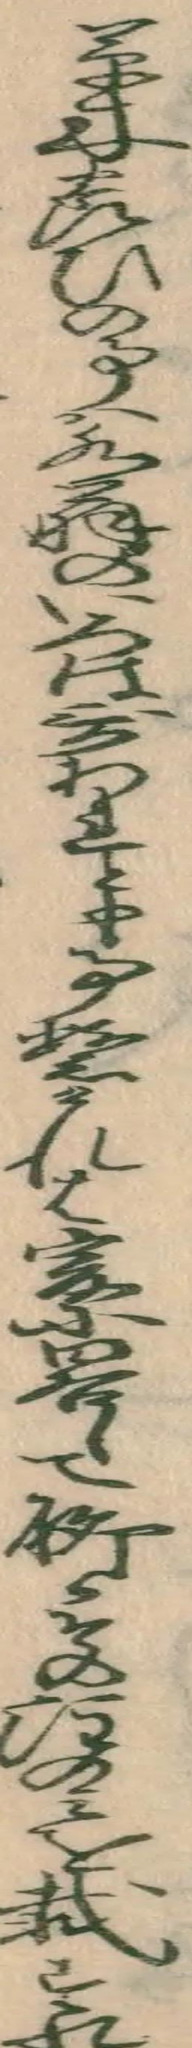○草木養ひの事は水翁のいろは歌あれとも事繁けれは爰に略して聊かその注のみを載すれ
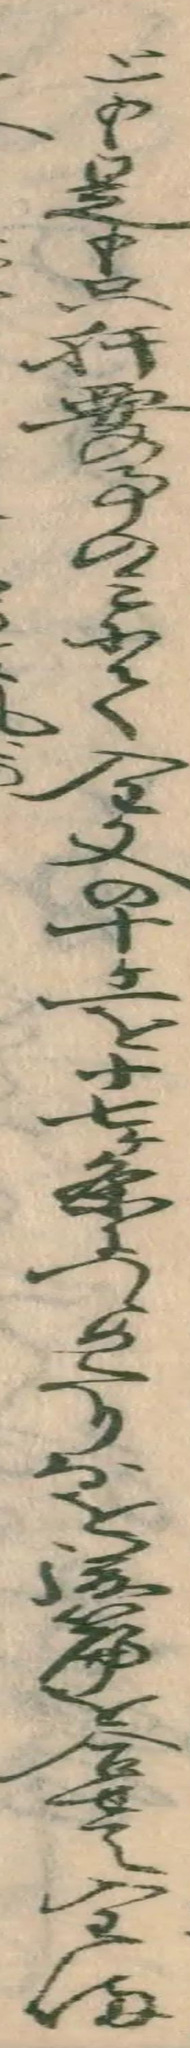とも是も只肝要の事のみにて全文の十ヶ一を十七ヶ条につゝめたりなを後篇を合せて全備
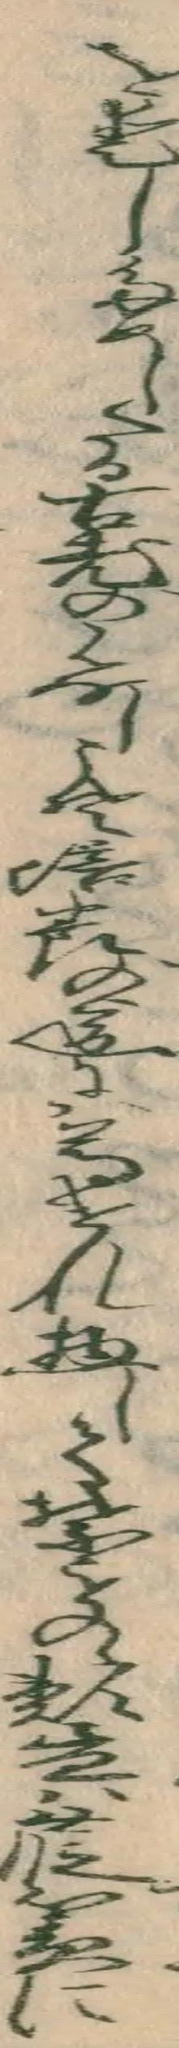を愛しためしたる古老のはなしこそ培養の道には尊けれ惣して柴もの類昼は葭簀に
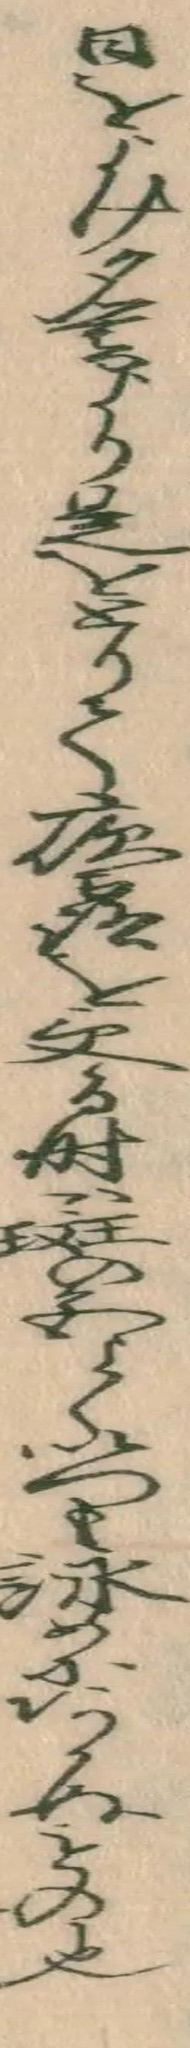日をよけ夕暮より是をとりて夜露を受る時は斑の色よくいつも詠めにあかぬもの也
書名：草木奇品家雅見 3巻. [3]
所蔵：国立国会図書館 National Diet Library, JAPAN
